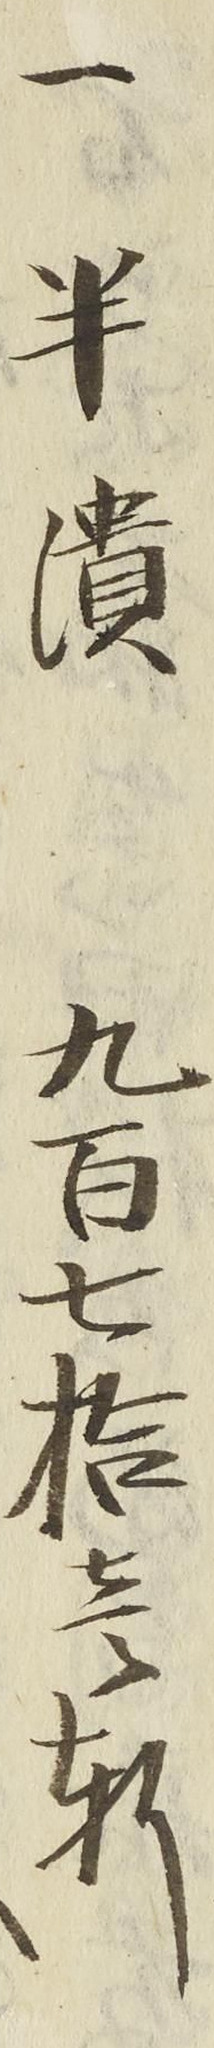一半潰九百七拾壱軒
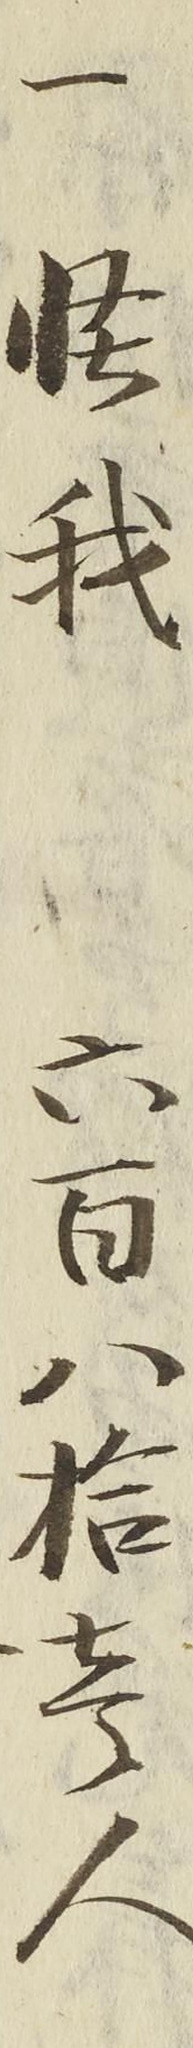一怪我六百八拾壱人
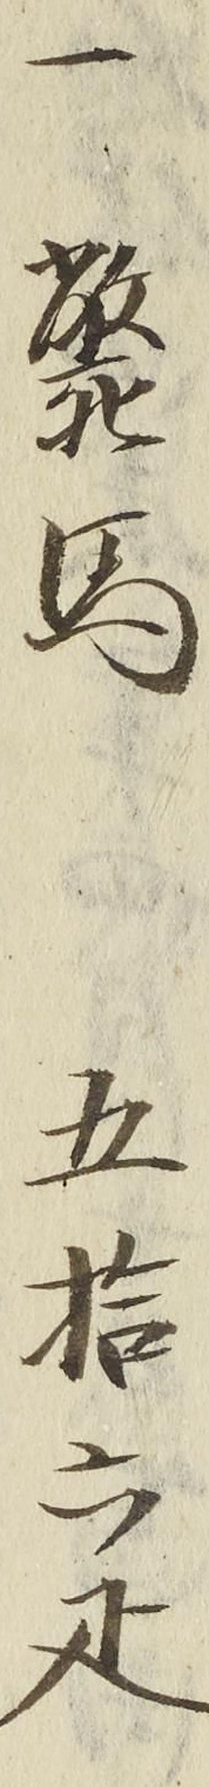一弊馬五拾六疋
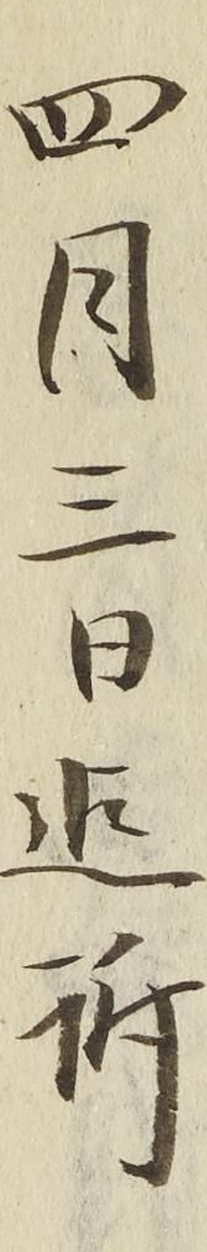四月三日迄訴
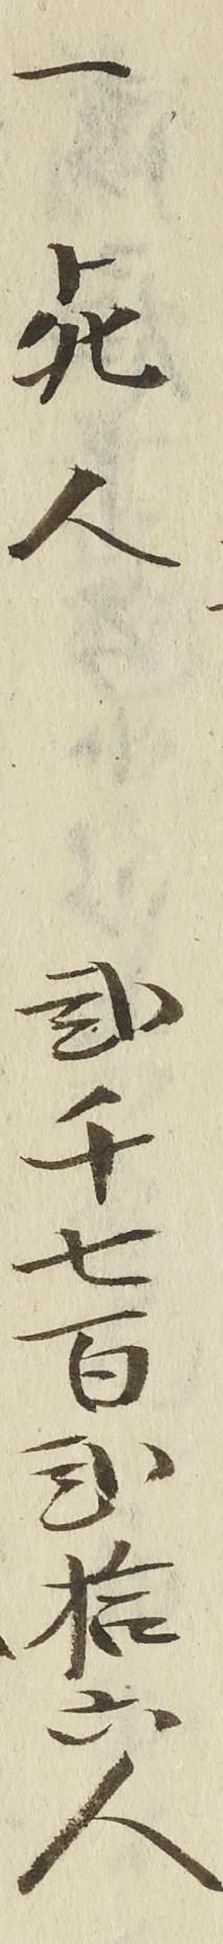一死人弐千七百弐拾六人
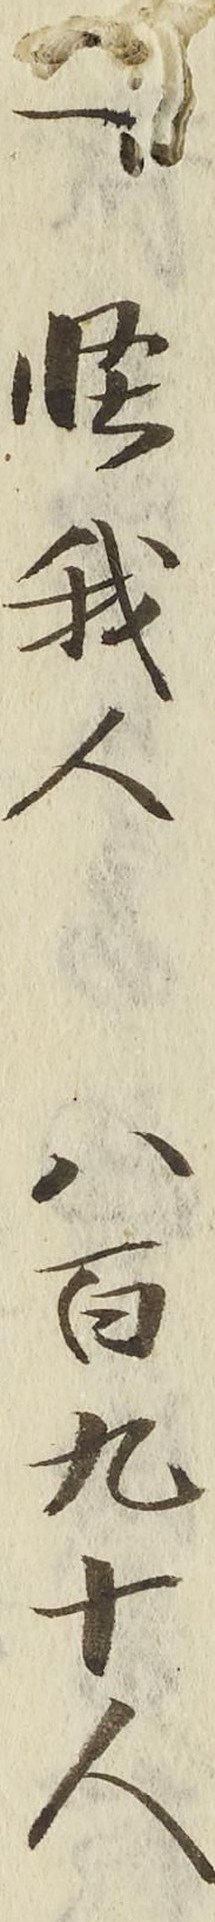一怪我人八百九十人
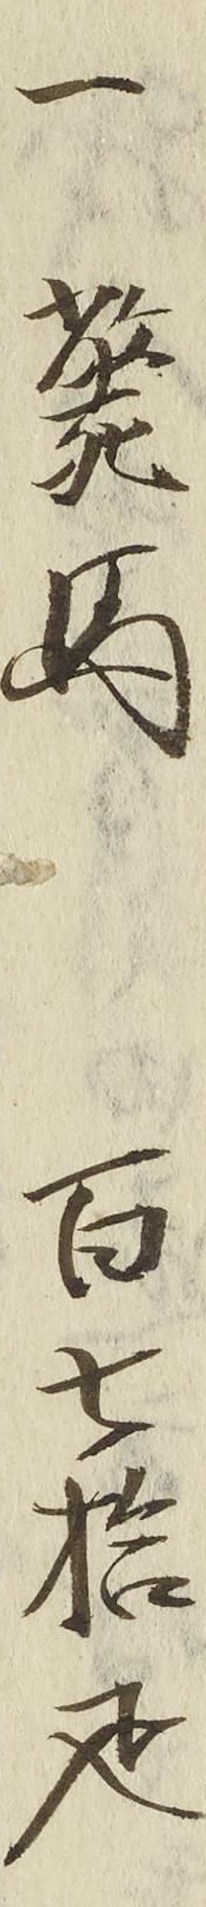一弊馬百七拾疋
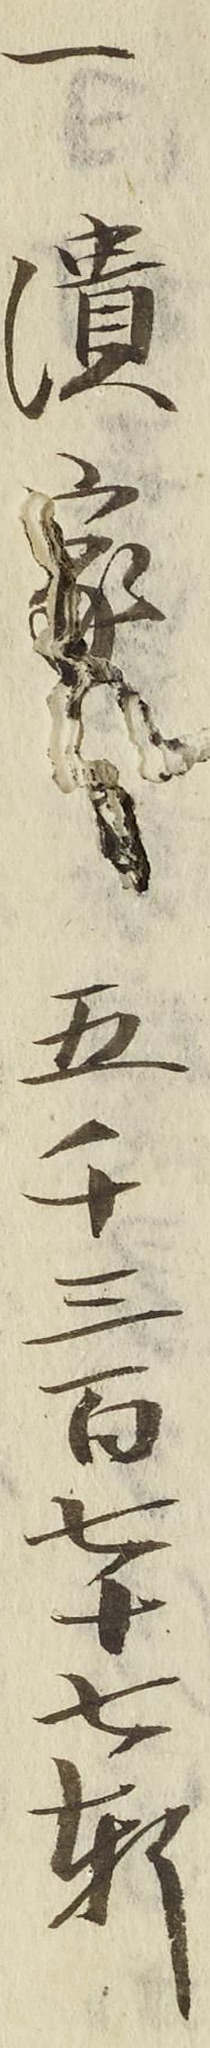一潰家五千三百七十七軒
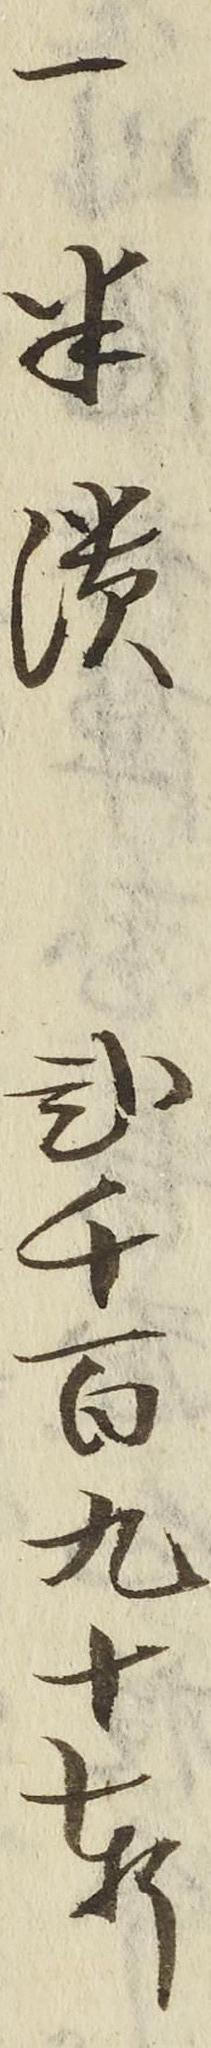一半潰弐千百九十七軒
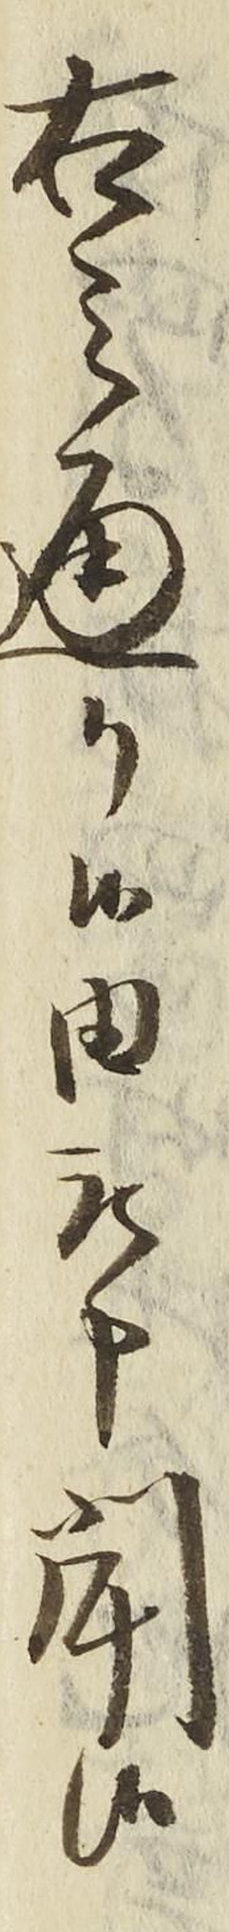右之通り候由被申聞候
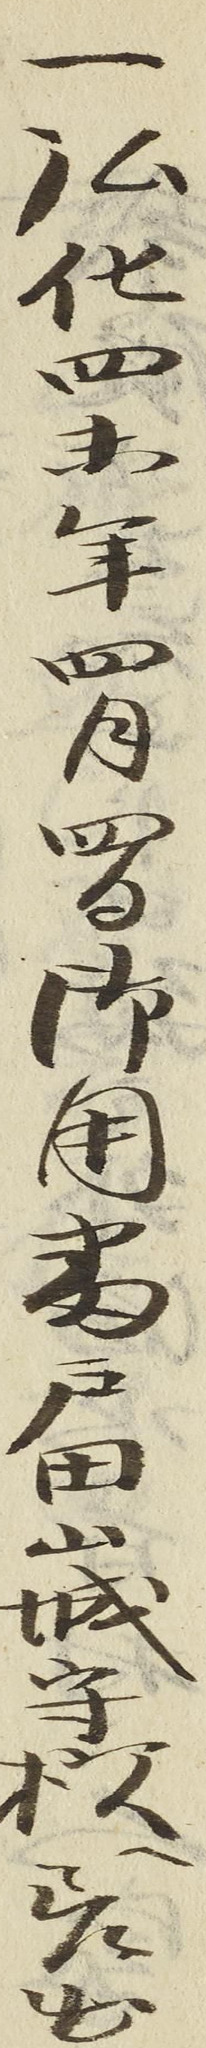一弘化四未年四月四日御用番戸田山城守様へ差出
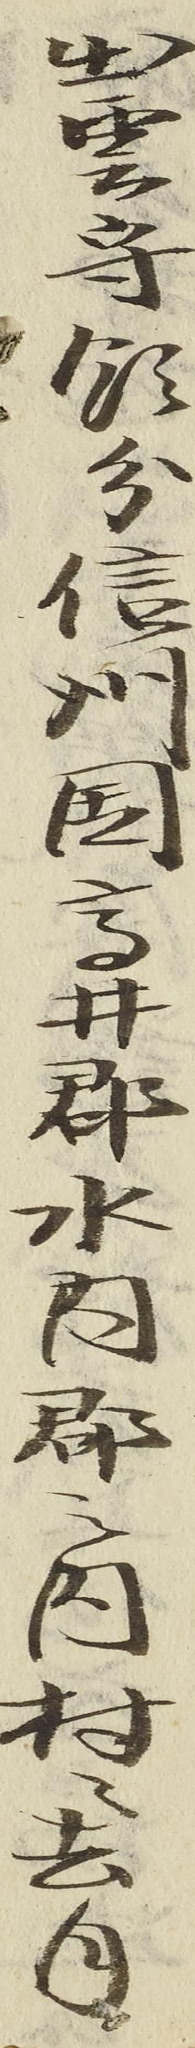出雲守領分信州国高井郡水内郡之内村々去月
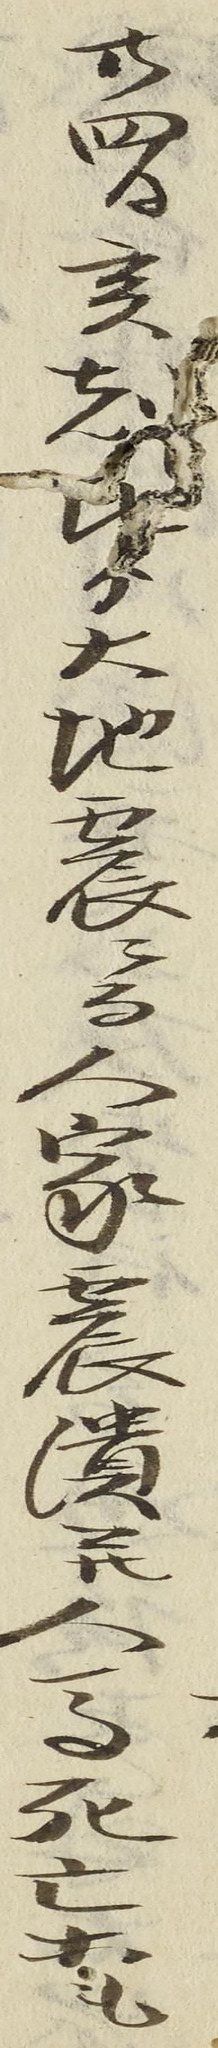廿四日亥刻比ゟ大地震二而人家震潰并人馬死亡等も
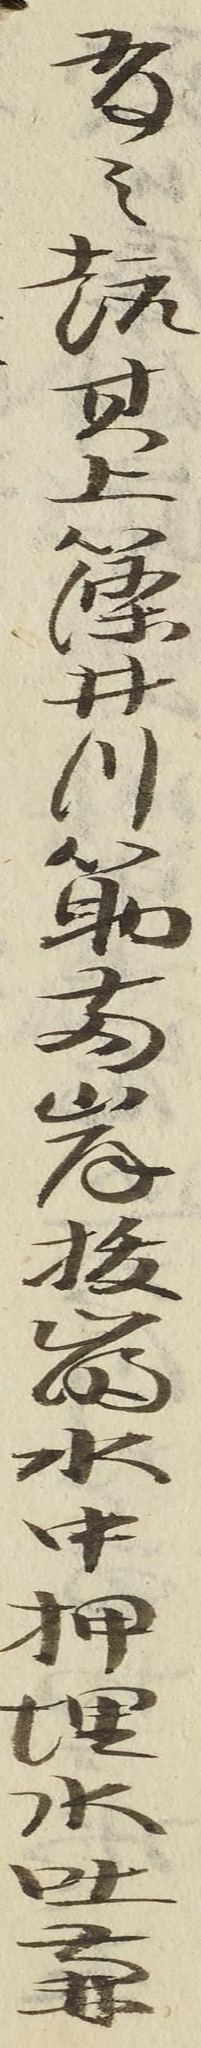有之趣其上篠井川筋両岸抜崩水中押埋水吐兼
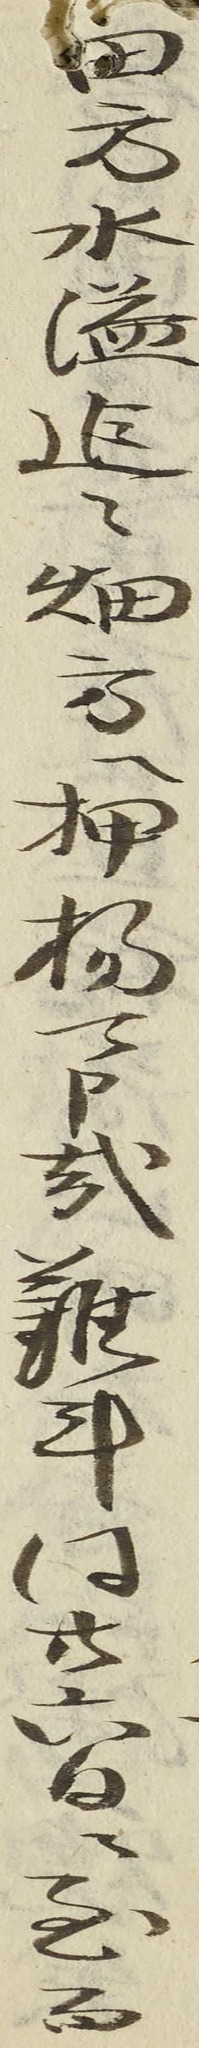田方水溢追々畑方へ押揚可申哉難斗同廿六日二至而
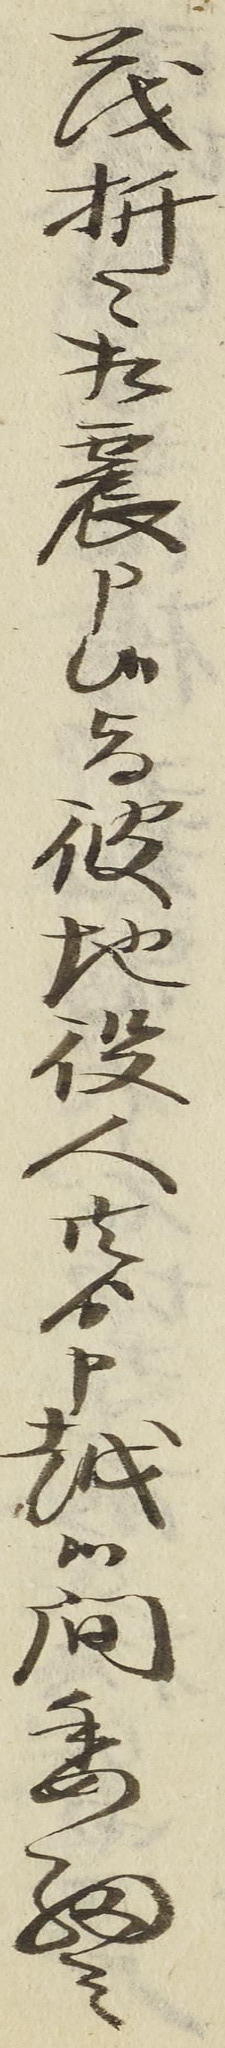も折々相震申候旨彼地役人ゟ申越候間委細之
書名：信濃國大地震記　乾
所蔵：東京大学地震研究所図書室 Earthquake Research Institute Library, The University of Tokyo, JAPAN
